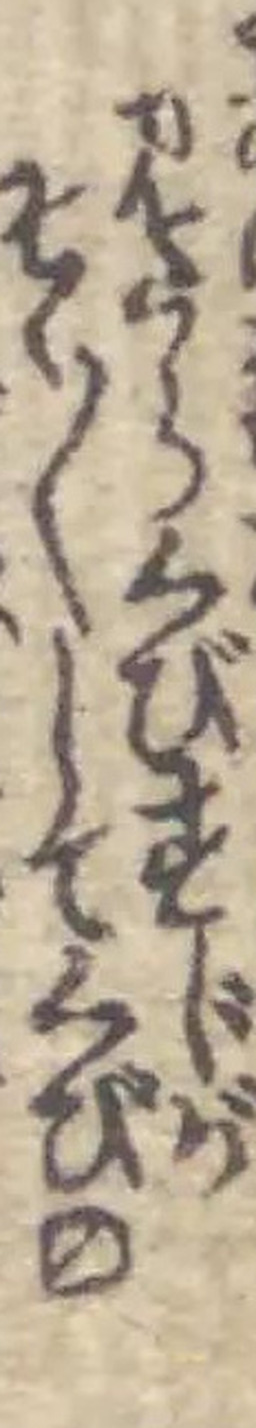そく〳〵してくびの
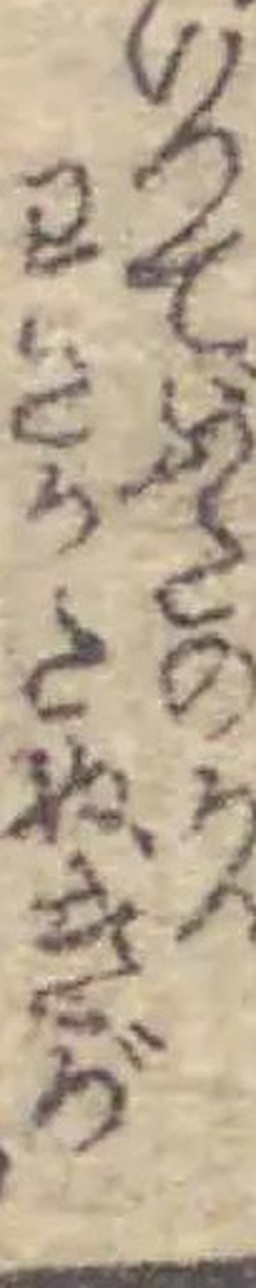わきかたぬきが
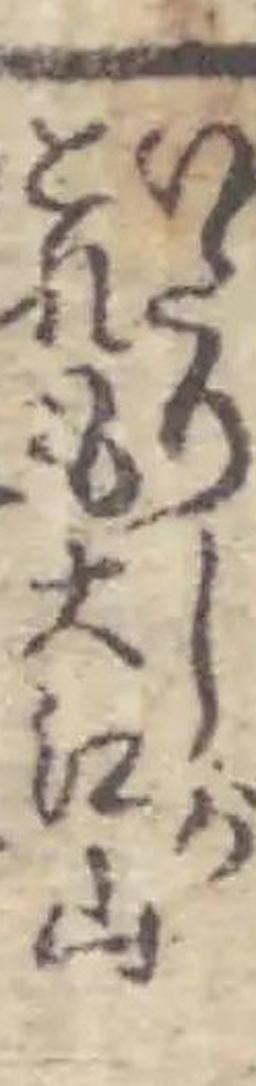これも大江山
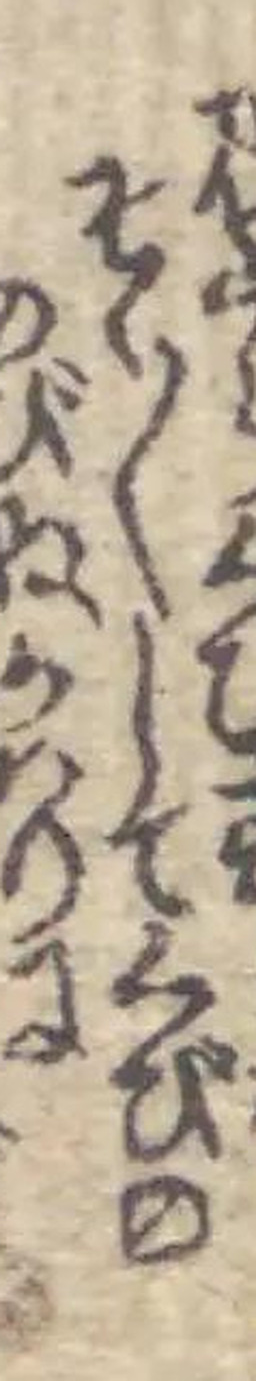のびねかはりに
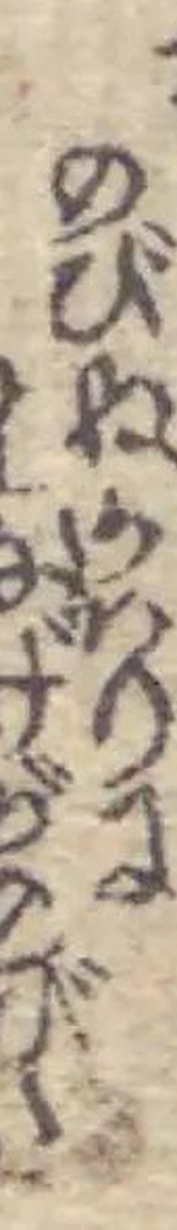のびねかはりに
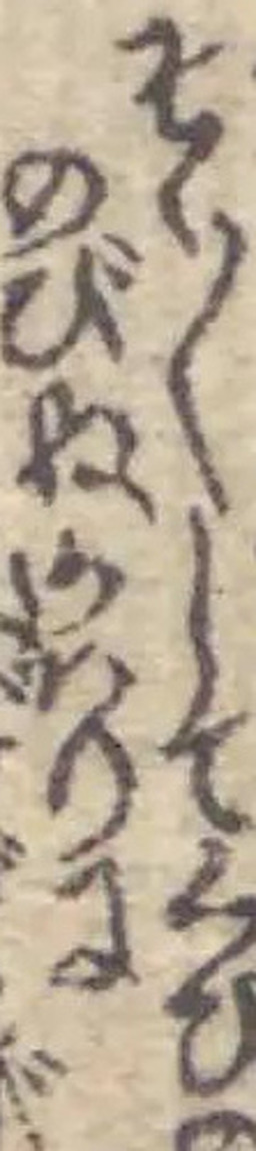のびねかはりに
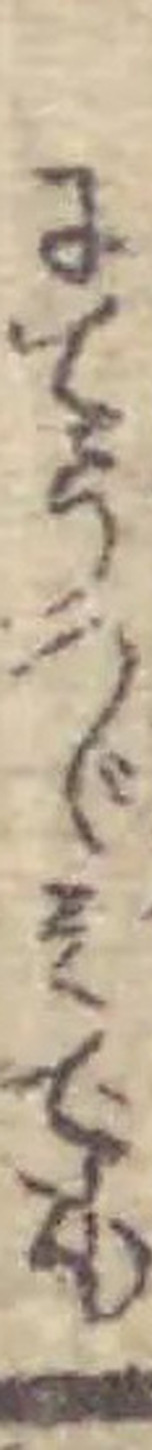にてうつゞみでも
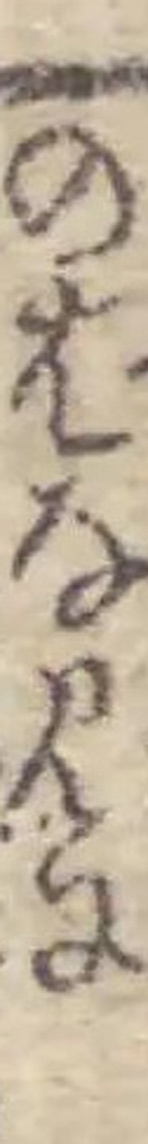のはな見に
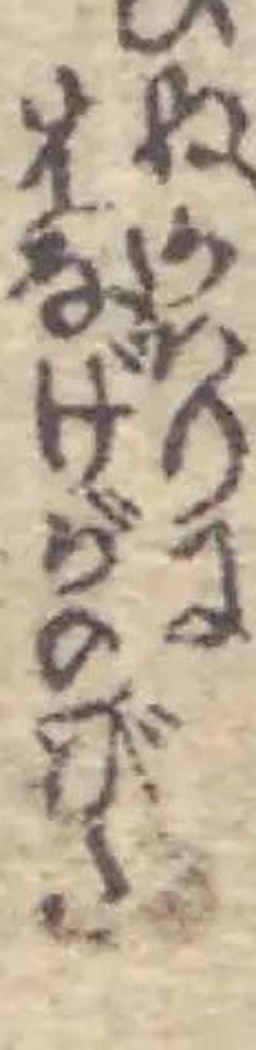はなげがのびた
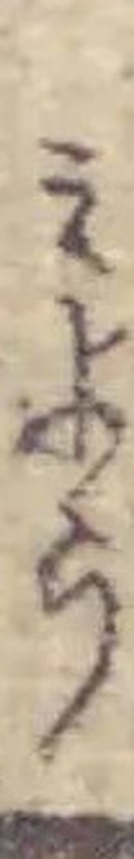みよう
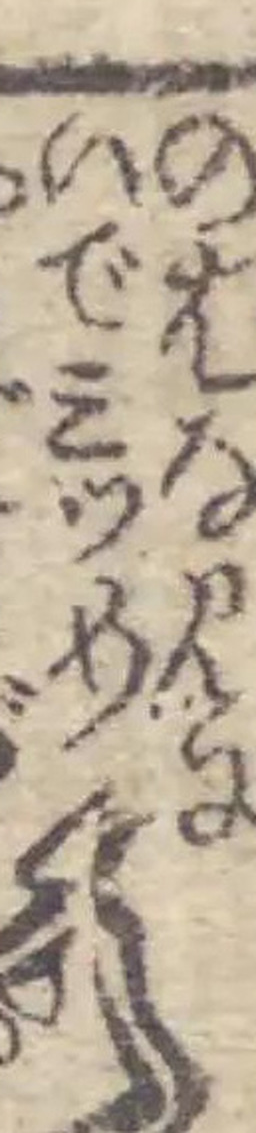いで三ッめ
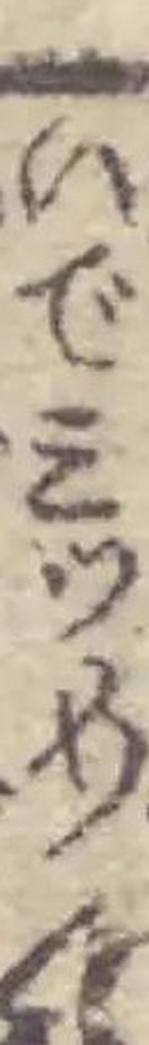いで三ッめ
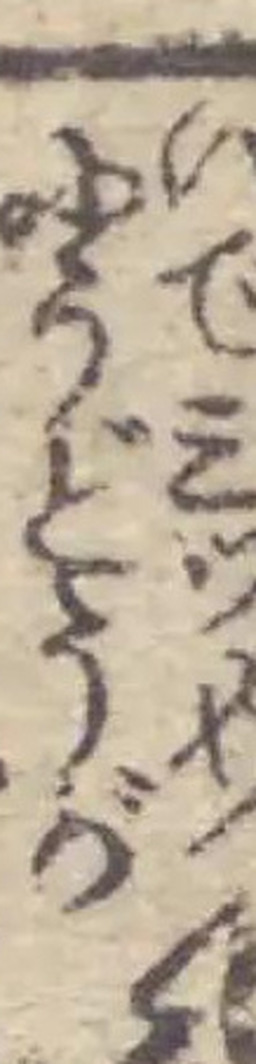にうどうが
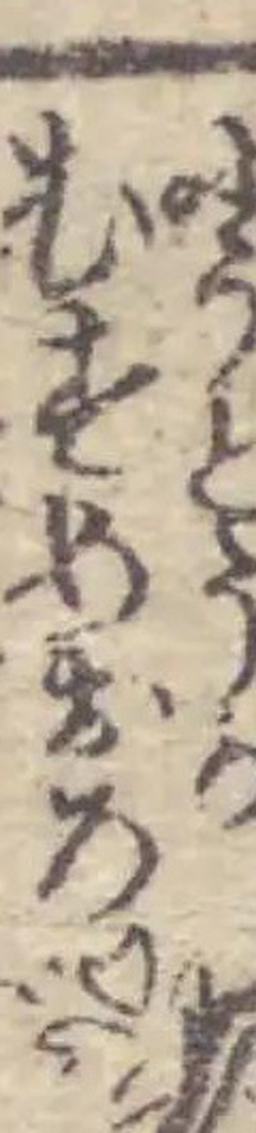むすめおろ
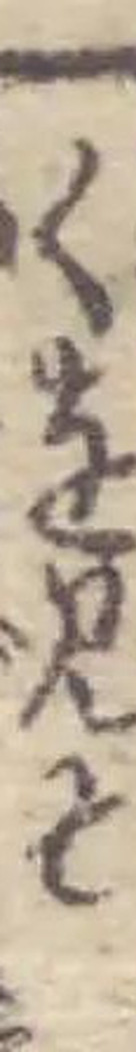くを見そ
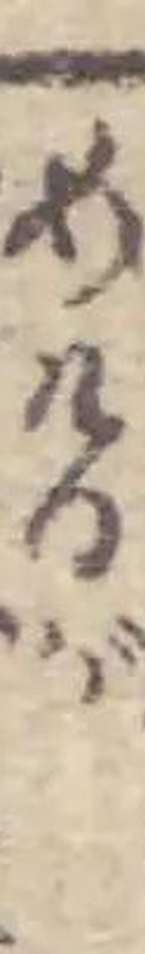めけるが
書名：化物尽 4巻
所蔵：国立国会図書館 National Diet Library, JAPAN
